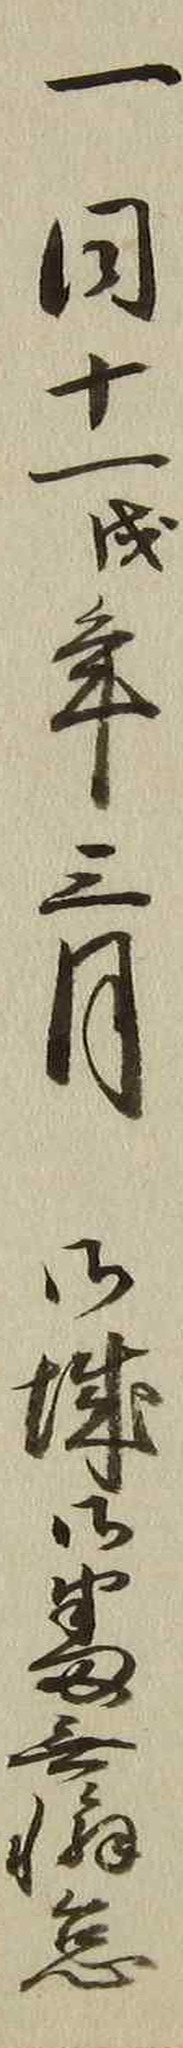一同十一戌年三月御城御番無懈怠
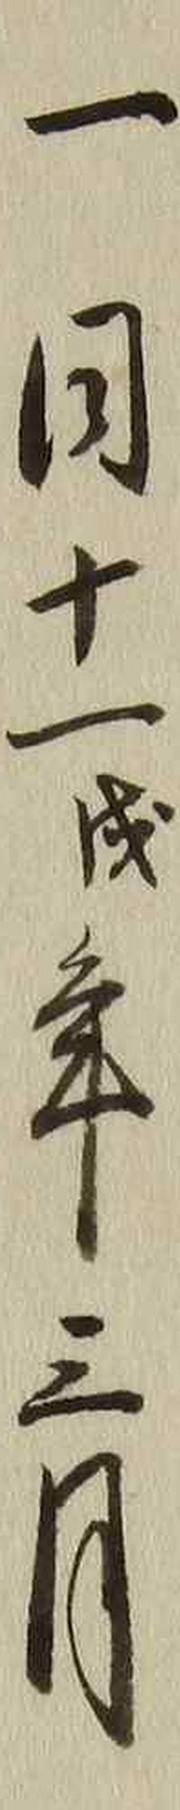一同十三子年四月
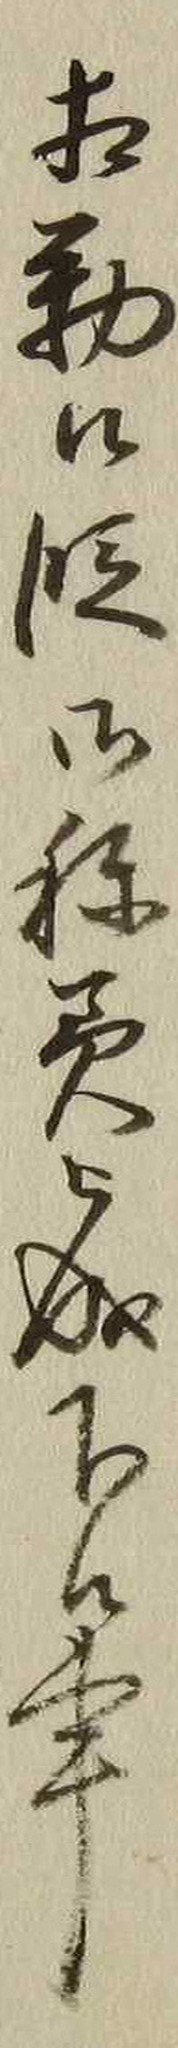相勤候段御称美被成下候事
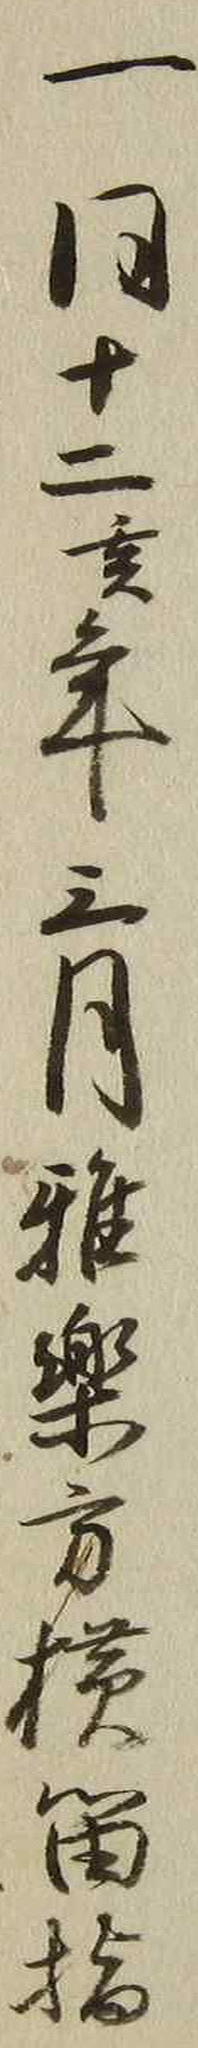一同十二亥年三月雅楽方横笛指
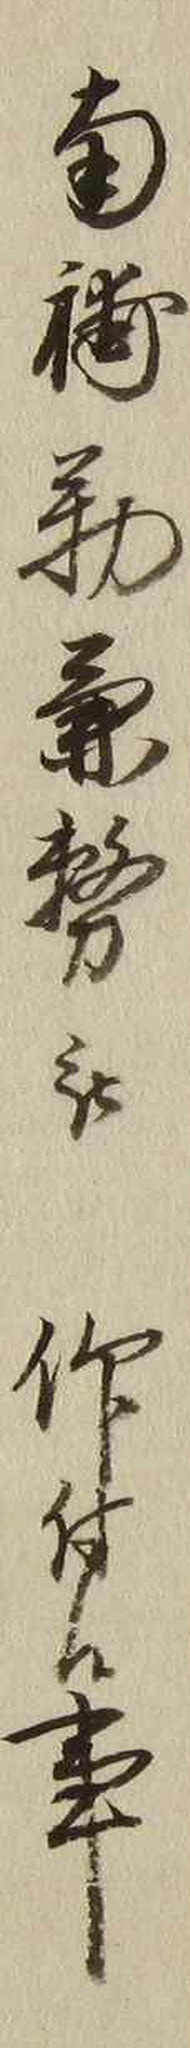南補勤兼務被仰付候事
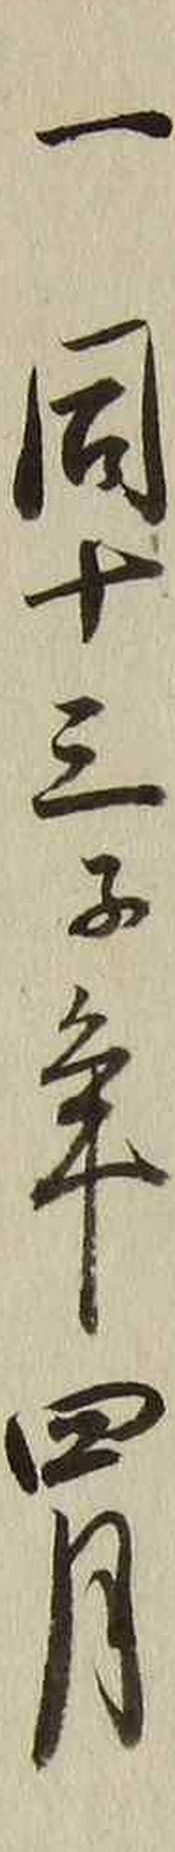一同十三子年四月
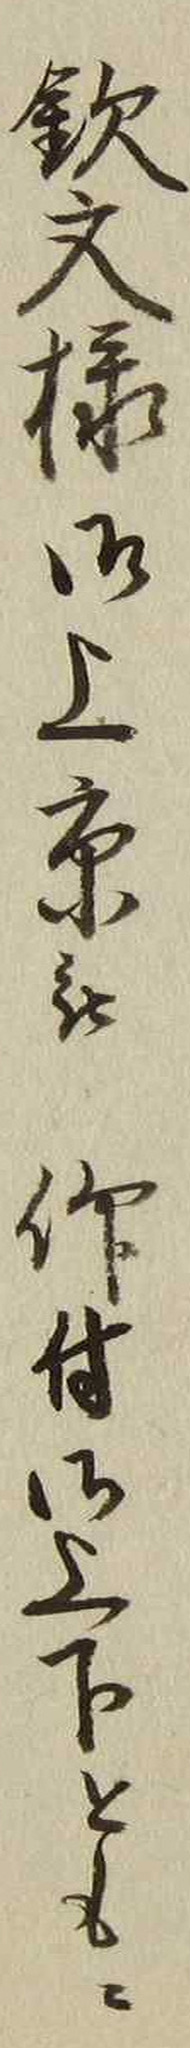欽文様御上京被仰付御上下ともに
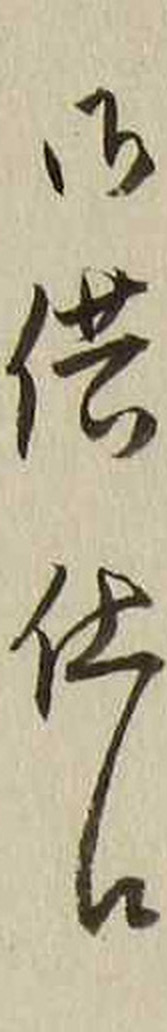御供仕候
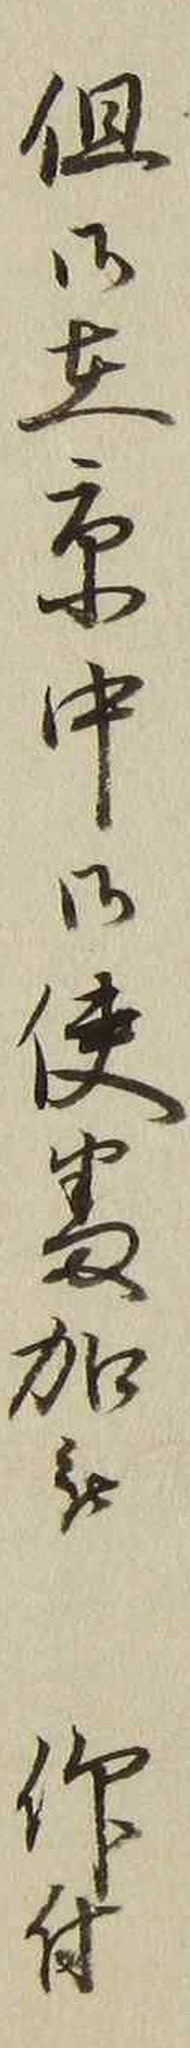但御在京中御使番加被仰付
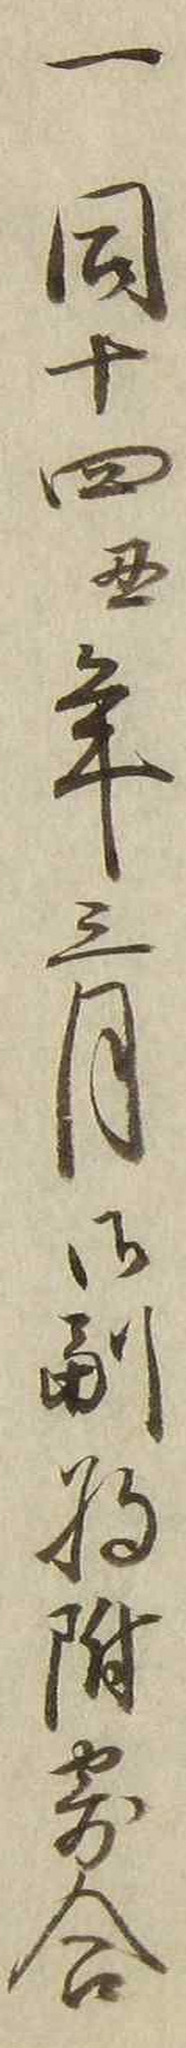一同十四丑年三月御副将附寄合

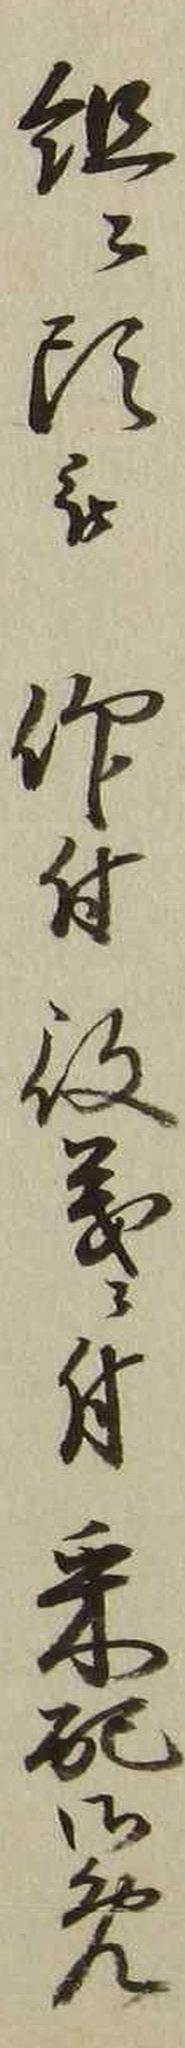組に頭被仰付役義に付采配御免
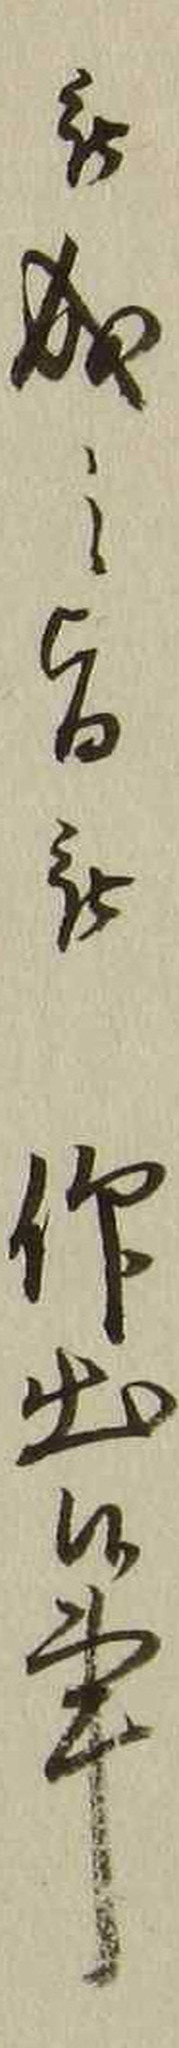被成之旨被仰出候事
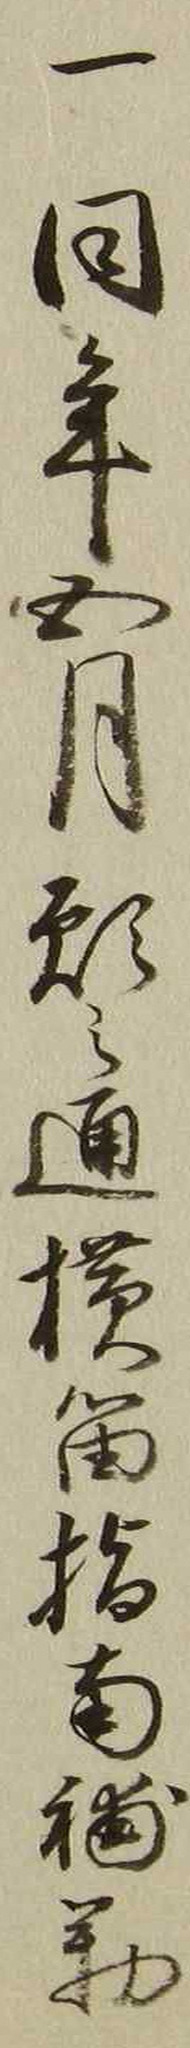一同年五月願之通横笛指南補勤
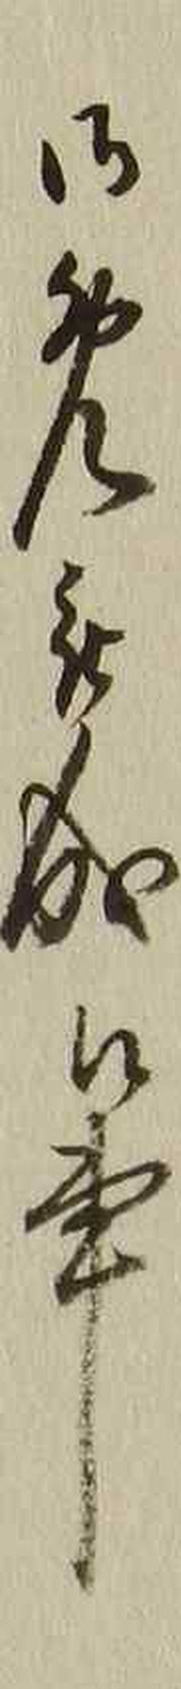御免被成候事
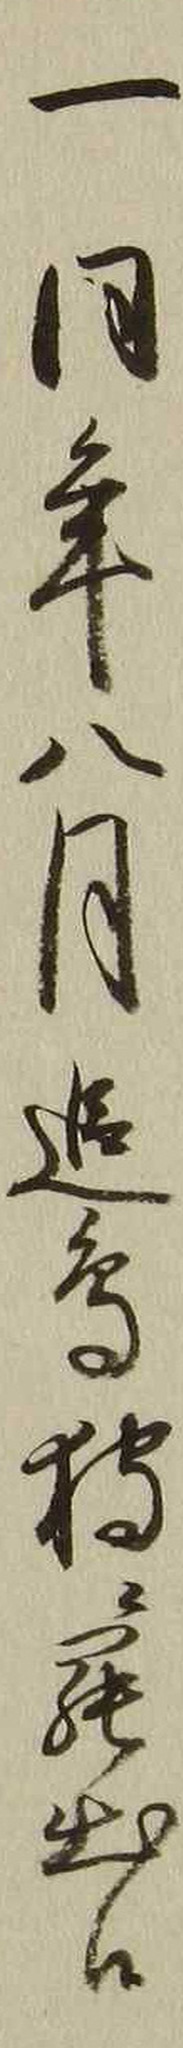一同年八月追鳥狩に罷出候
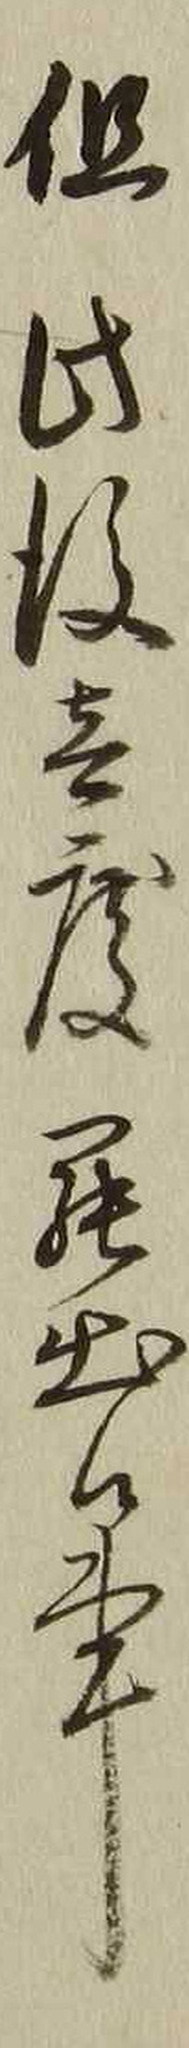但此後壱度罷出候事
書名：諸士系譜　巻之133　た之部9
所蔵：会津若松市立会津図書館
